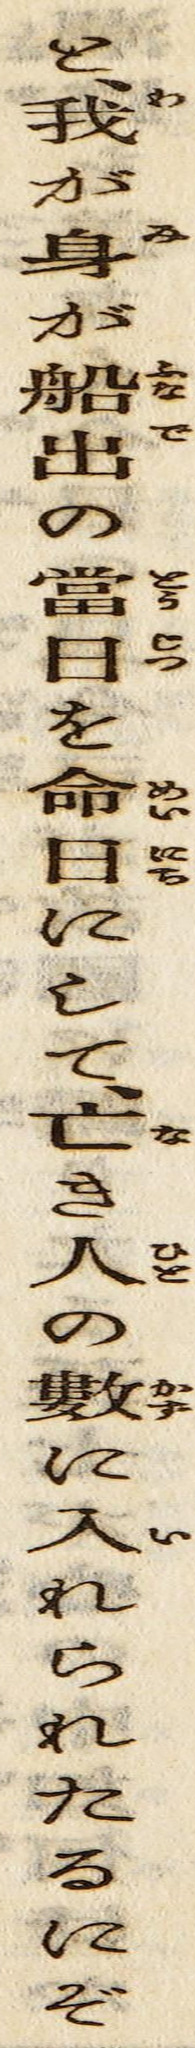と、我が身が船出の当日を命日にして、亡き人の数に入れられたるにぞ
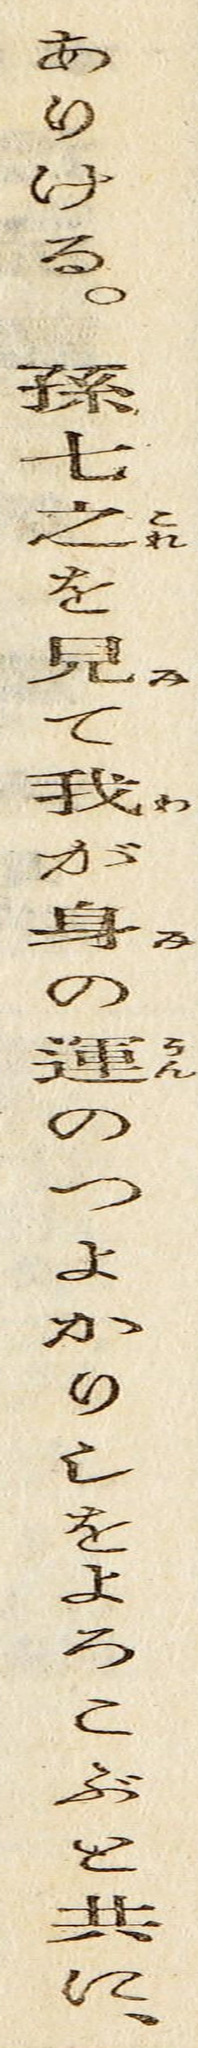ありける。孫七之を見て我が身の運のつよかりしをよろこぶと共に、
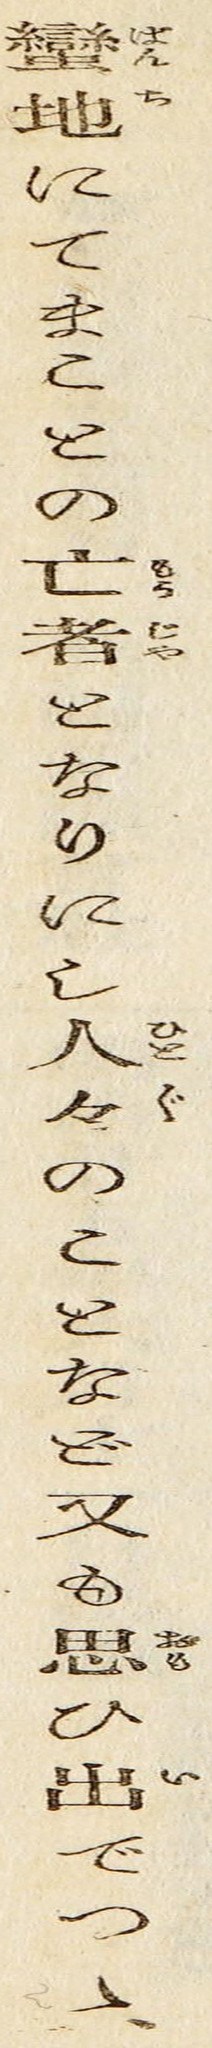蛮地にてまことの亡者となりにし人々のことなど又も思ひ出でつゝ、
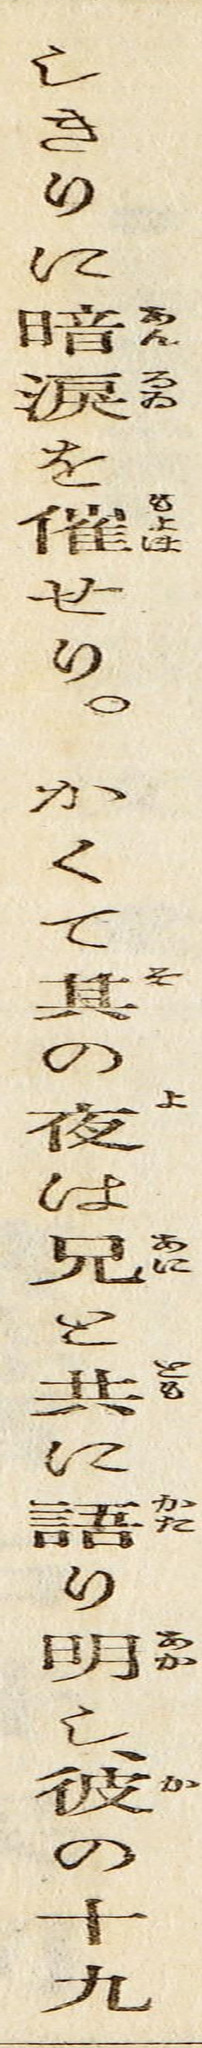しきりに暗涙を催せり。かくて其の夜は兄と共に語り明し、彼の十九
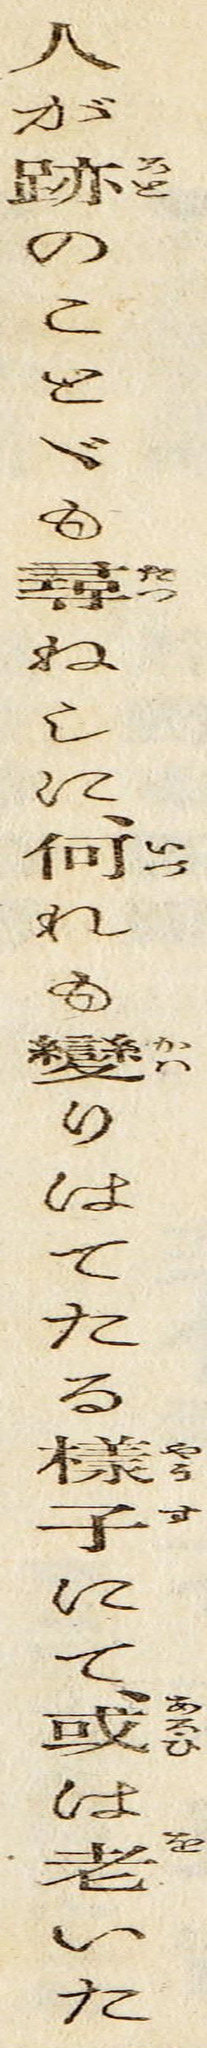人が跡とのことヾも尋ねしに、何れも変りはてたる様子にて、或は老いた
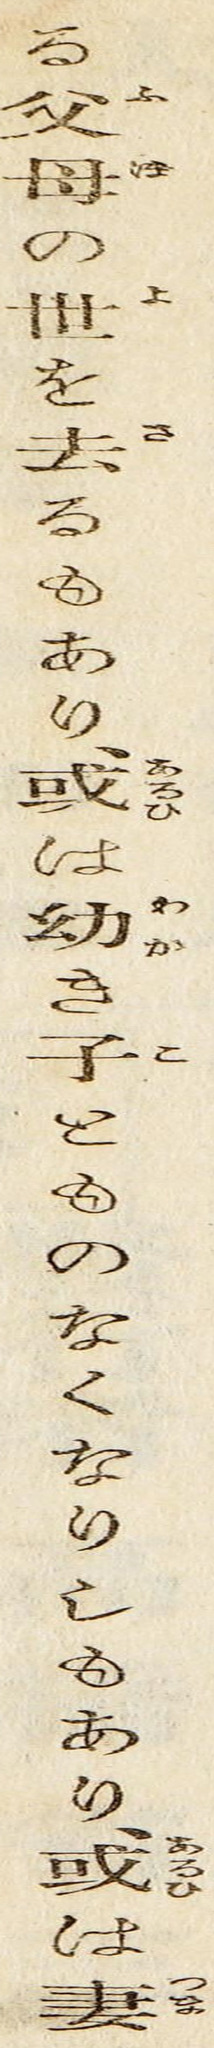る父母の世を去るもあり、或は幼き子とものなくなりしもあり、或は妻
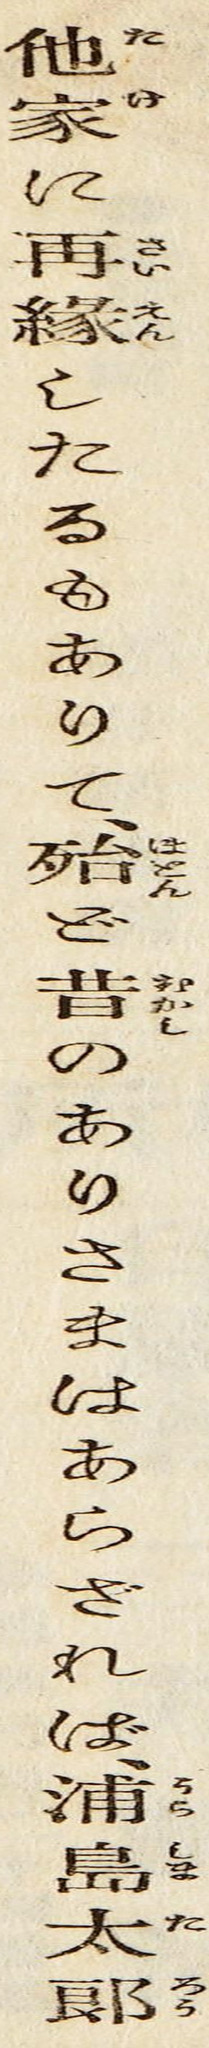他家に再縁したるもありて、殆ど昔のありさまはあらざれば、浦島太郎
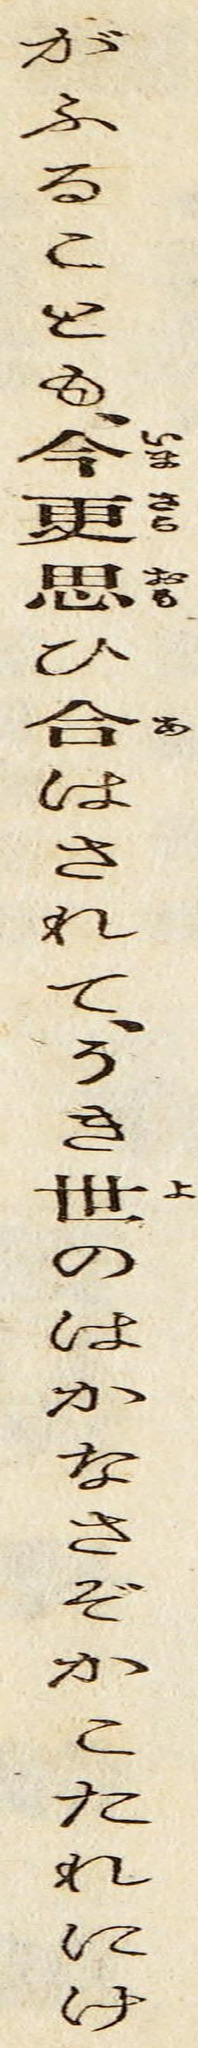がふることも、今更思ひ合はされて、うき世のはかなさぞかこたれにけ
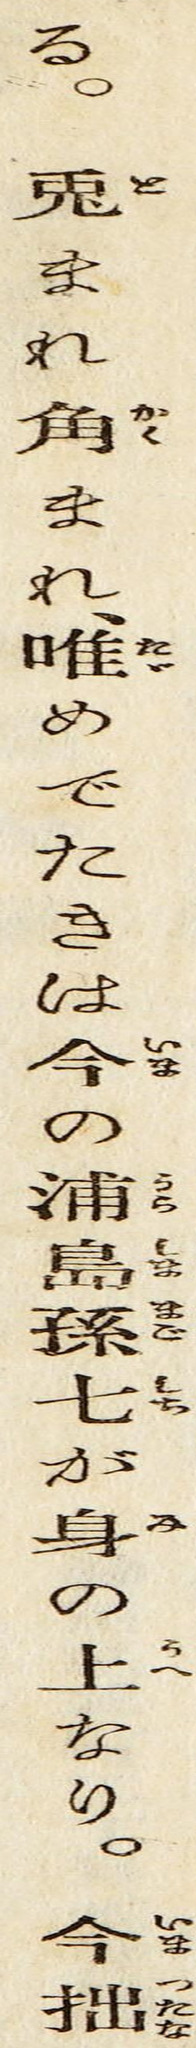る。兎まれ角まれ、唯めでたきは今の浦島孫七が身の上なり。今拙
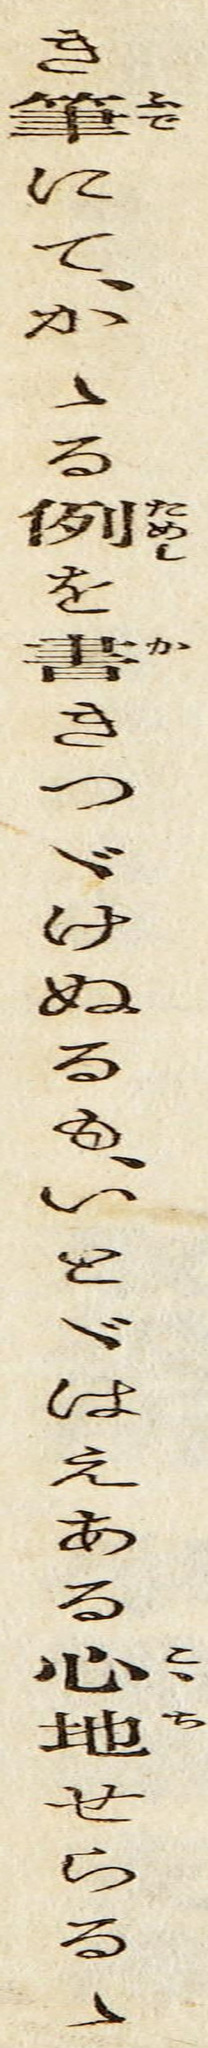き筆にて、かゝる例を書きつヾけぬるも、いとヾはえある心地せらるゝ
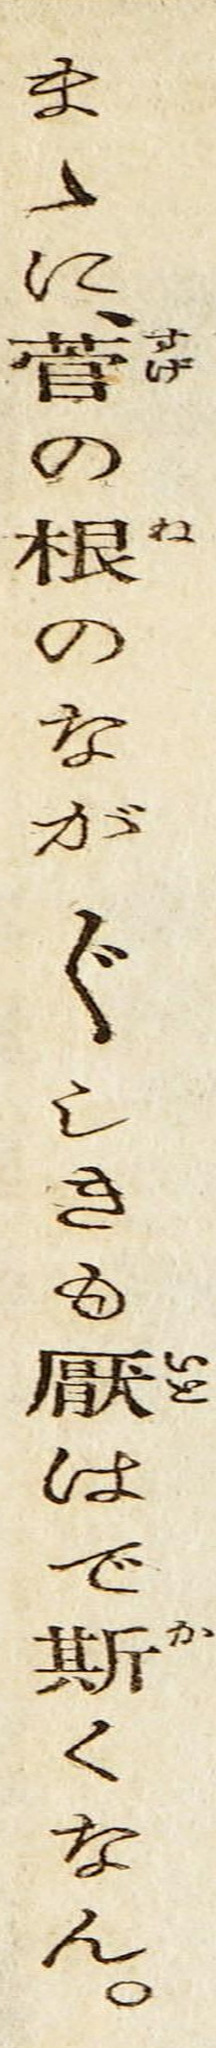まゝに、菅の根のなが〴〵しきも厭はで斯くなん。

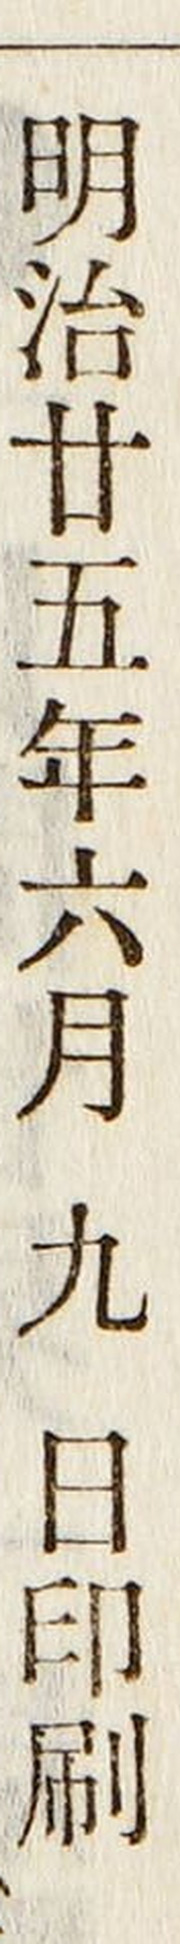明治廿五年六月九日印刷
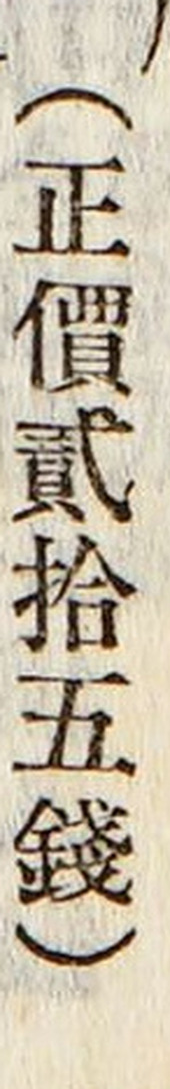(正価弐拾五銭)
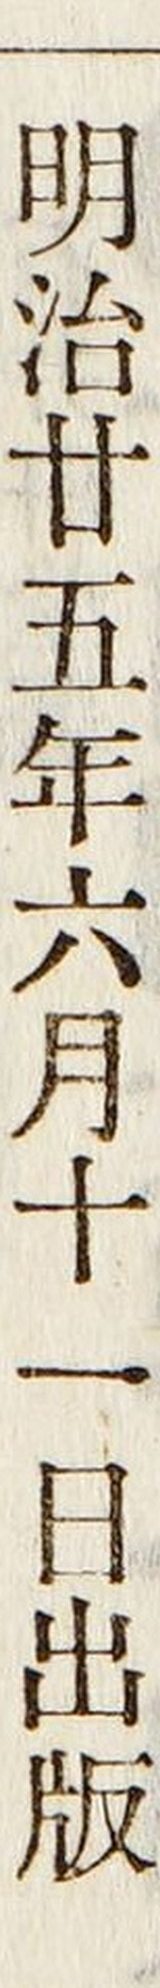明治廿五年六月十一日出版
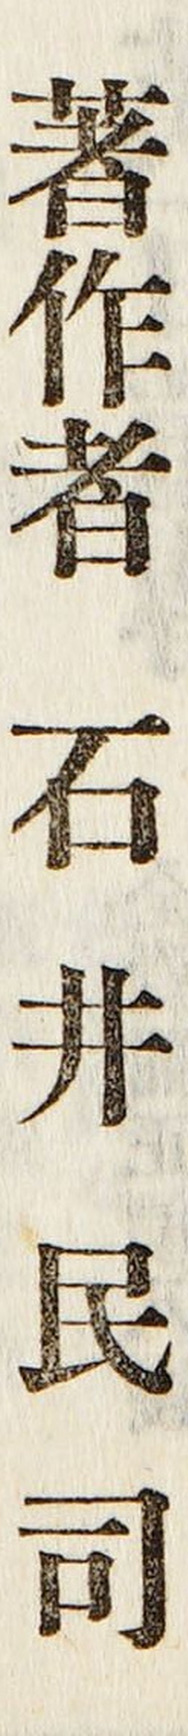著作者石井民司
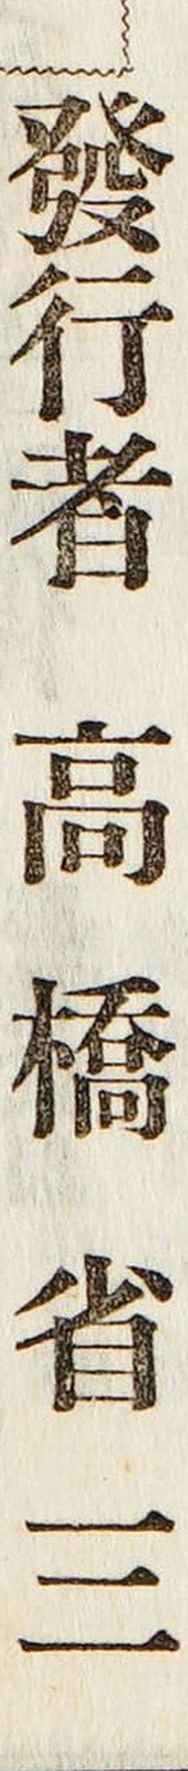発行者高橋省三
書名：日本漂流譚
